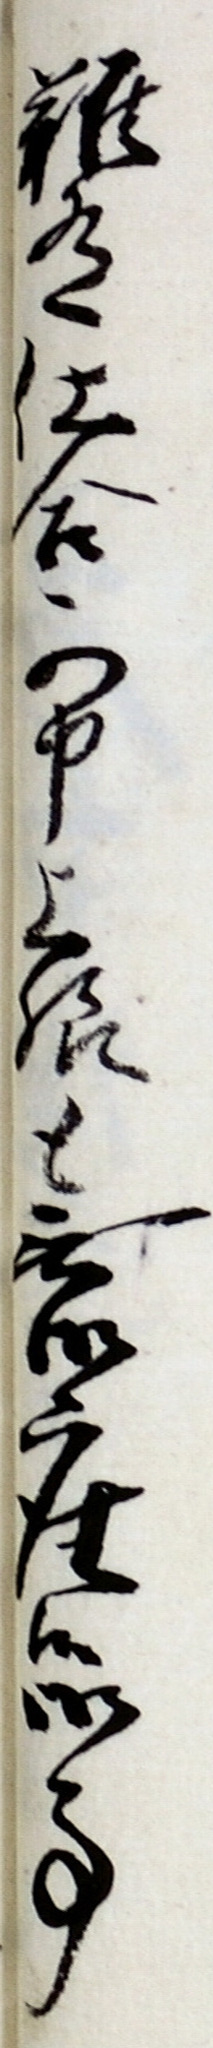難有仕合可申上様も無御座候御事
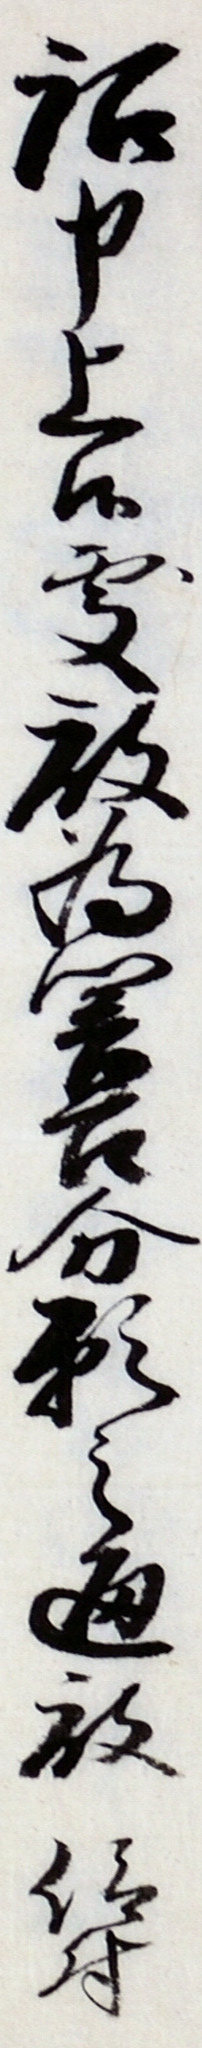訟申上候処被為闇召分願之通被仰付
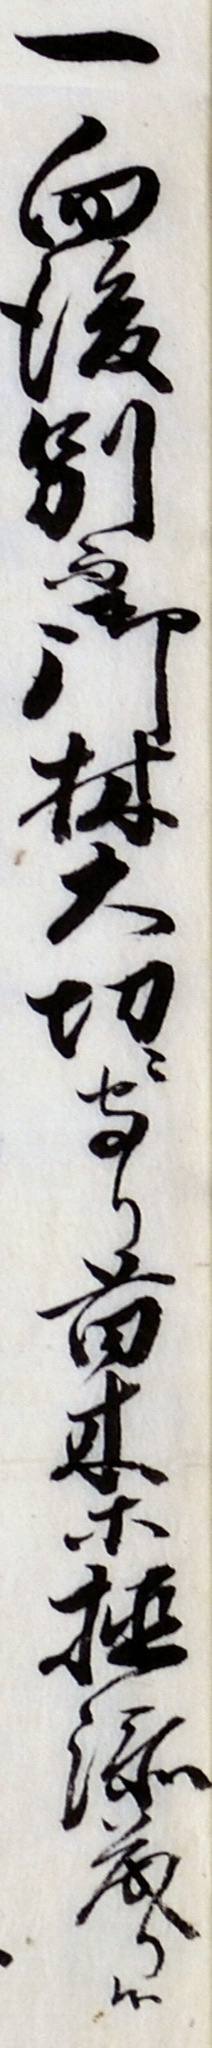一向後別而御林大ニ守り苗木等植添茂り候
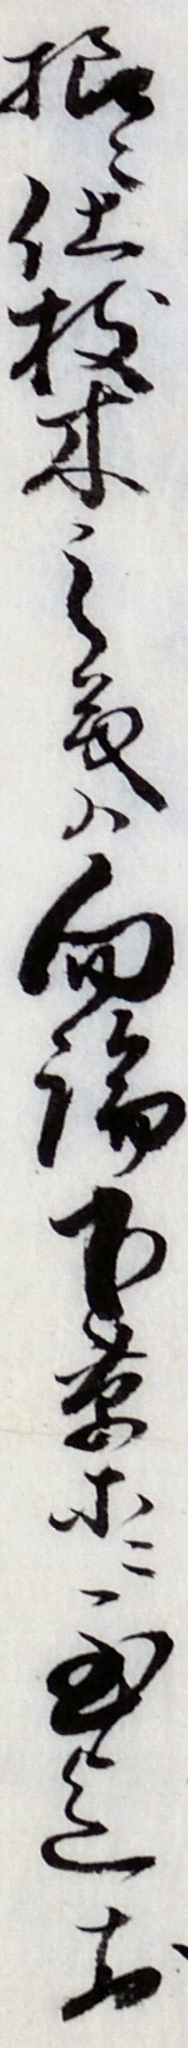様ニ仕枝木之義ハ勿論下草等ニ至迄於
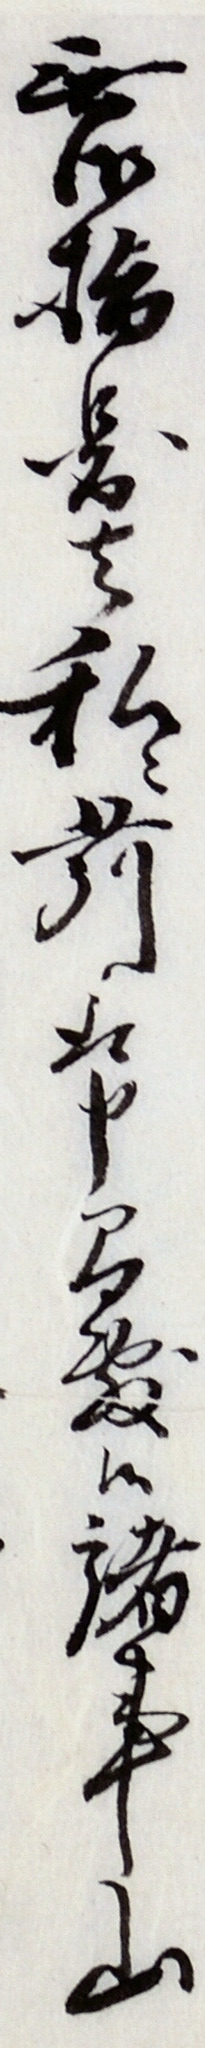無御指図は私ニ苅取申間敷候諸事山
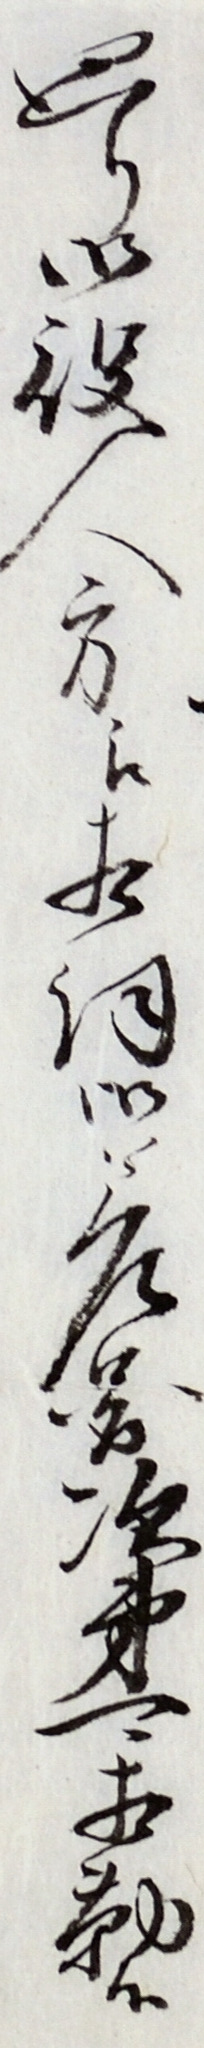廻り御役人方え相伺御差図次第可相勤候
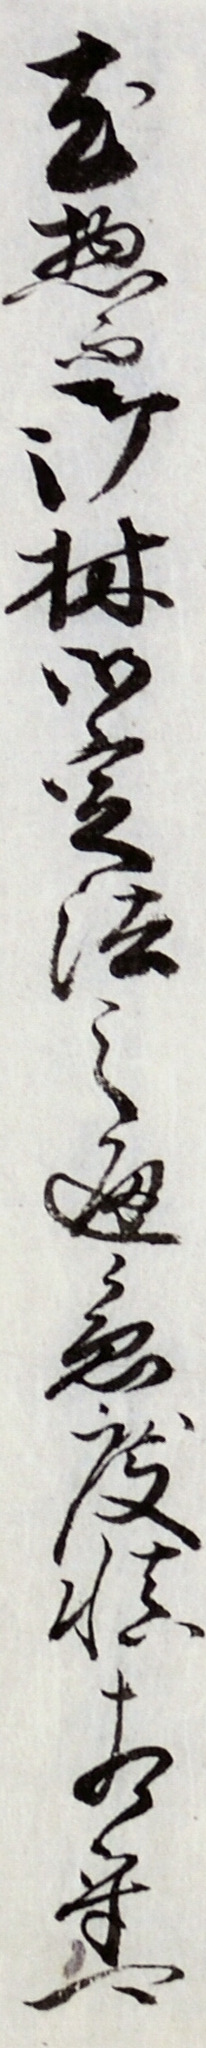尤惣而御林御定法之通ニ急度慎相守可
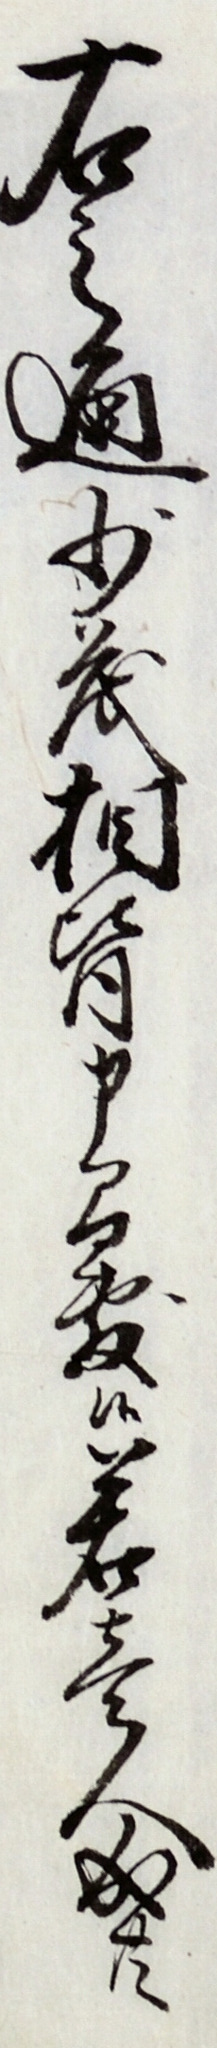右之通少も相背申間敷候若壱人成共
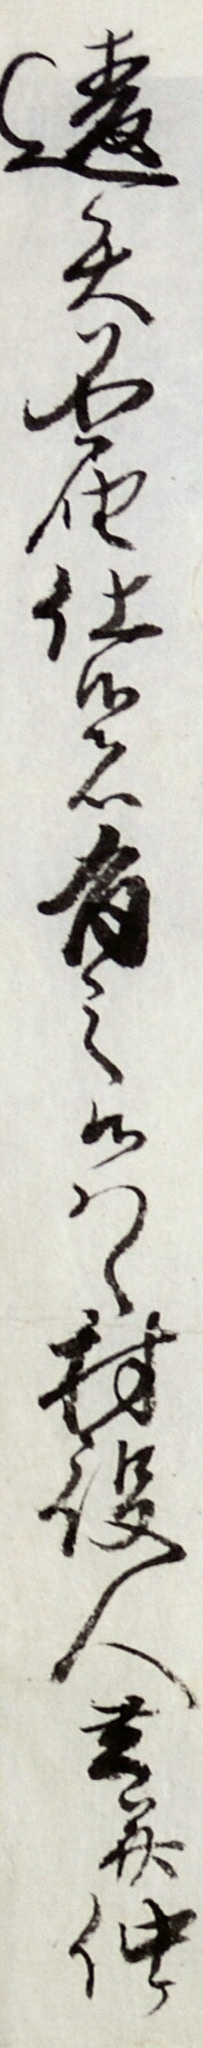違失不届仕候者有之候ハヽ村役人共并仲ヶ

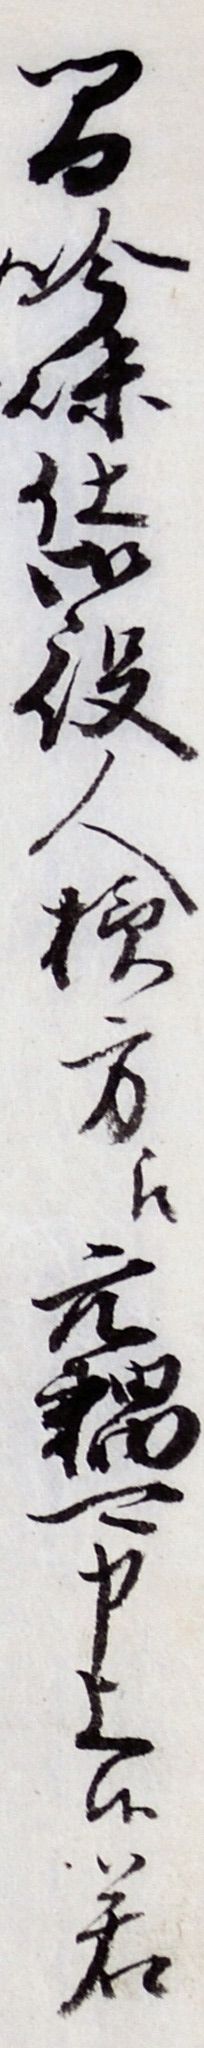間吟味仕御役人様方え元可申上候若
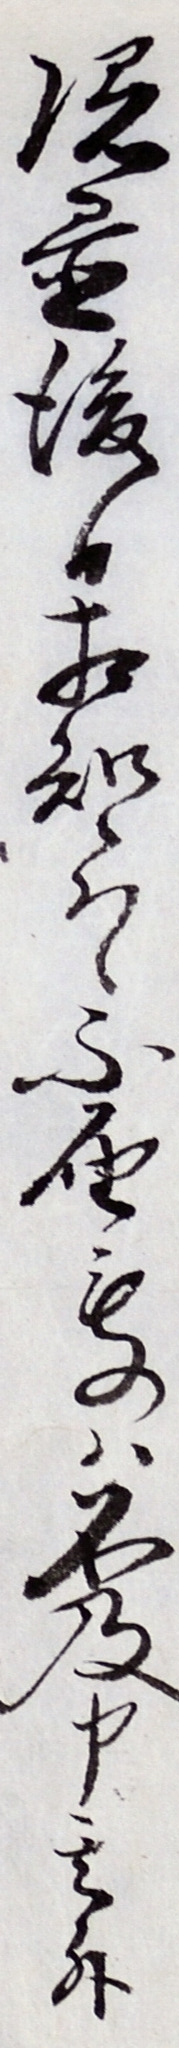隠置後日相知候ハヽ不届ものハ不及申其外
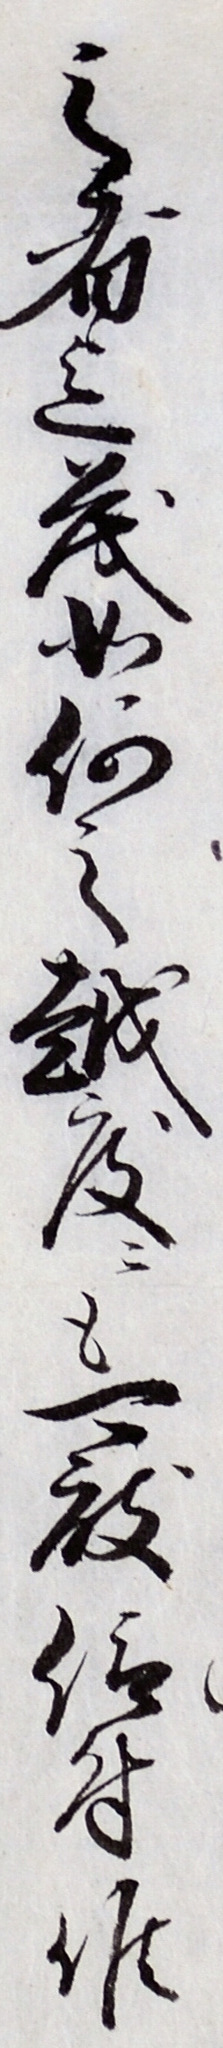之者迄も如何之越度ニも可被仰付候
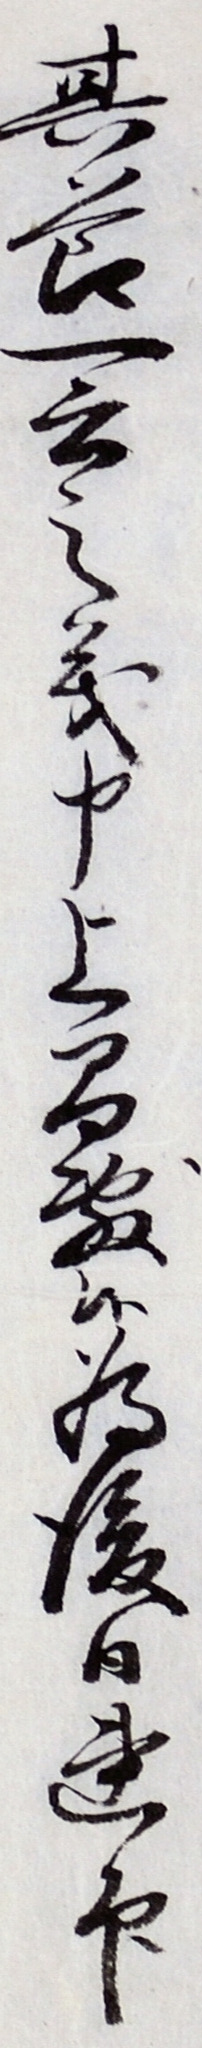其節一言之義申上間敷候為後日連印
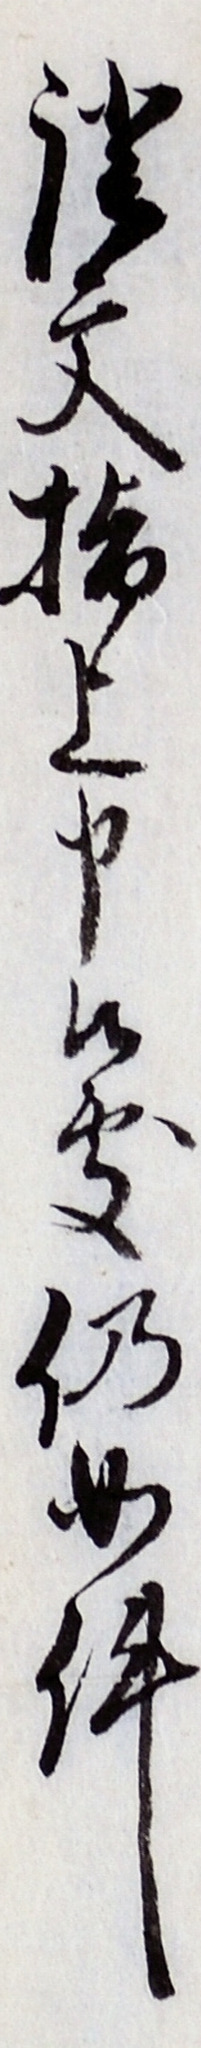証文指上申候処仍如件
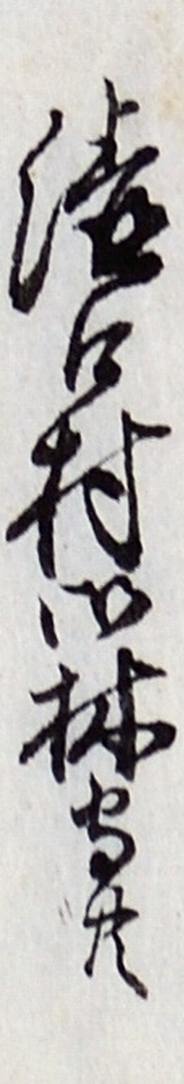渋口村御林守共
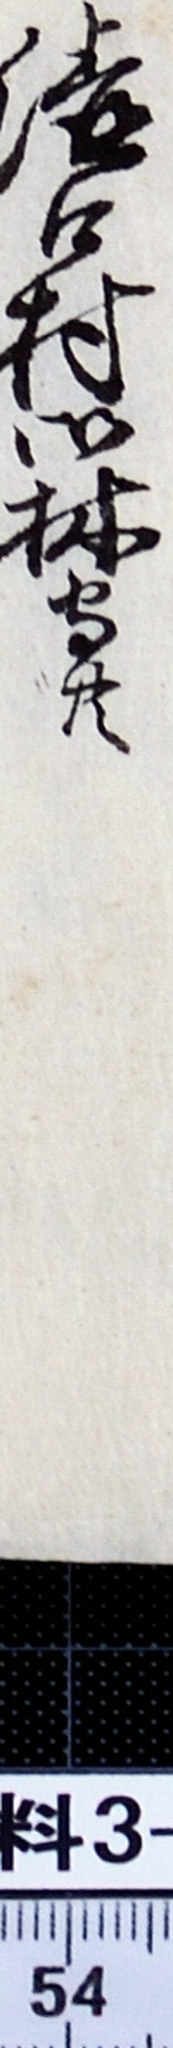渋口村御林守共
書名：御林御竹藪証文控
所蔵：伊那市立高遠町図書館・合同会社AMANE
